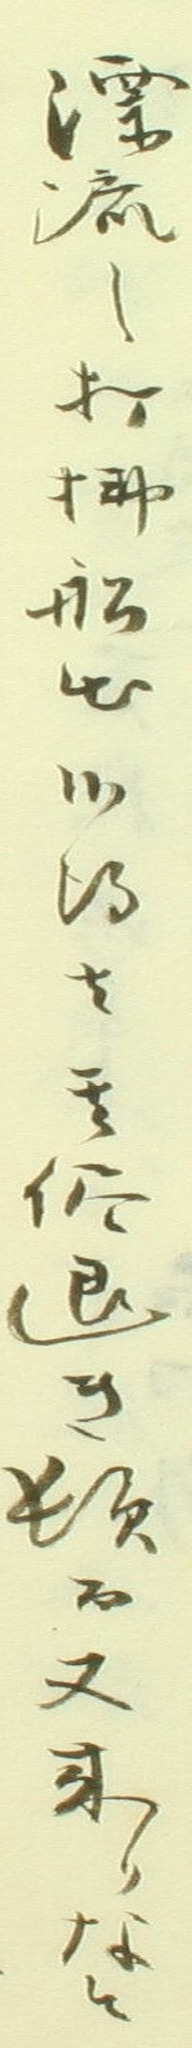漂流し打払船出候得は其侭退き頓而又来りなと
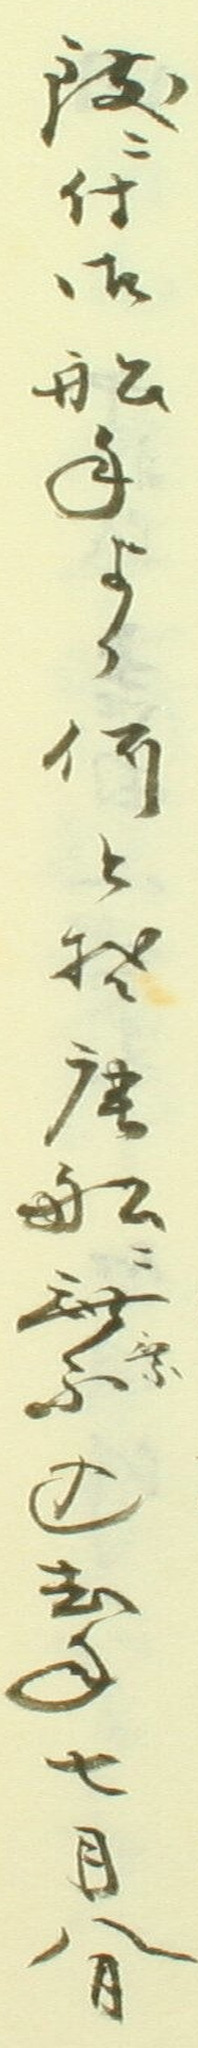致に付御船手より何とそ唐船に乗込去年七月八月
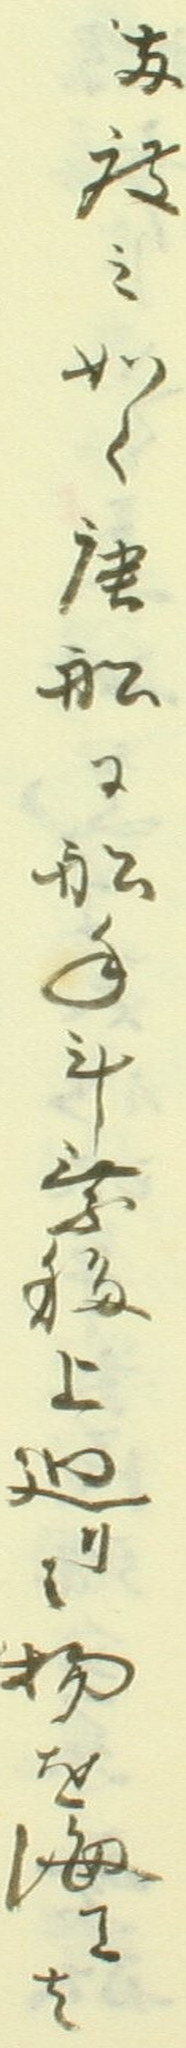両度之如く唐船に船手斗乗移上廻り之物を海には
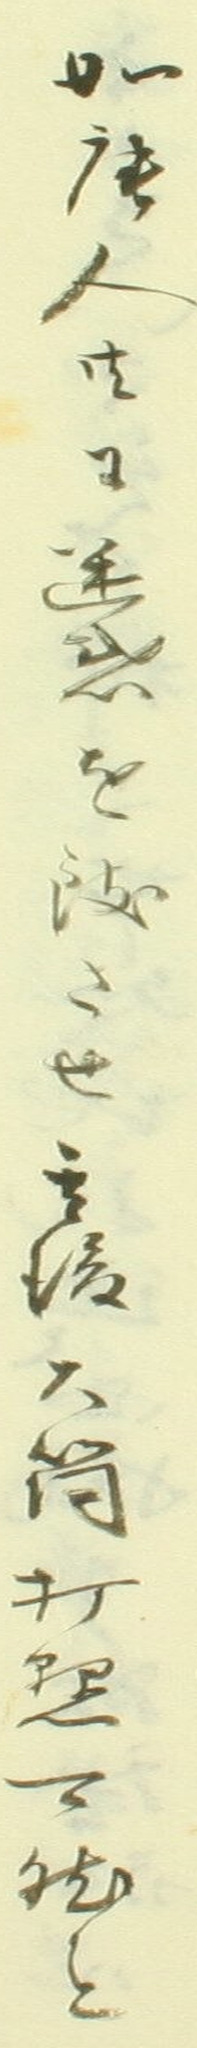如唐人共に迷惑を致させ其後大筒打懸可然と
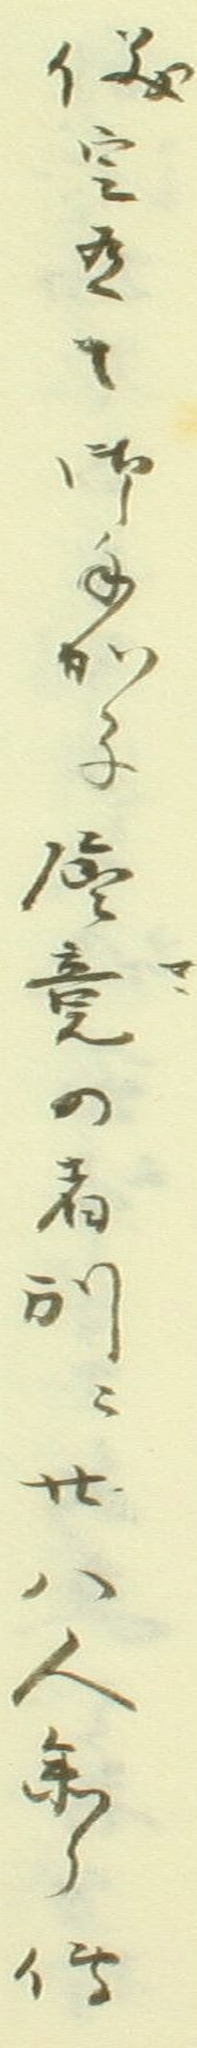儀定有て御手加子隋竟の者別々廿八人余り伝
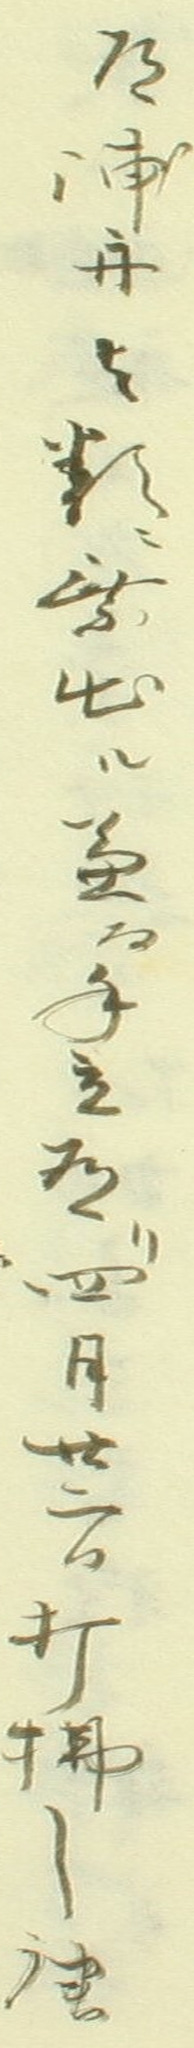道浦舟は類に乗出る兼而手立有り四月廿ニ日打払し唐
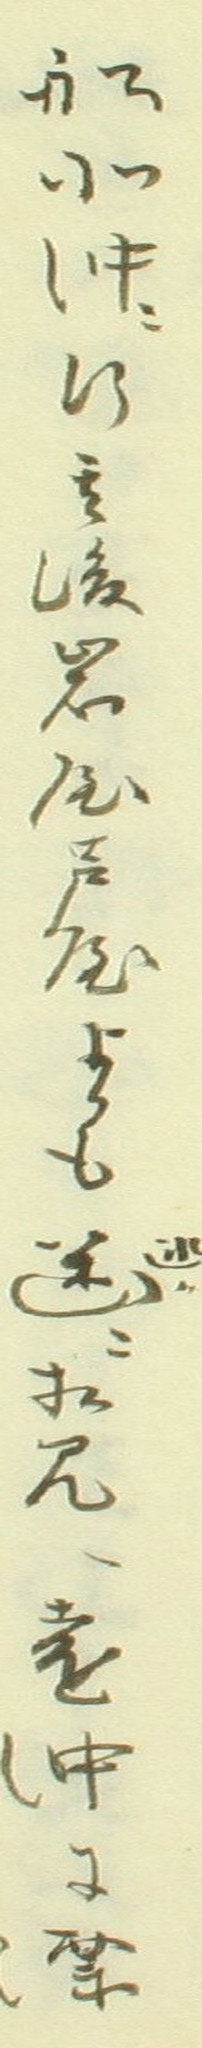船北沖に行其後岩屋芦屋よりも？に相見へ遠沖に漂
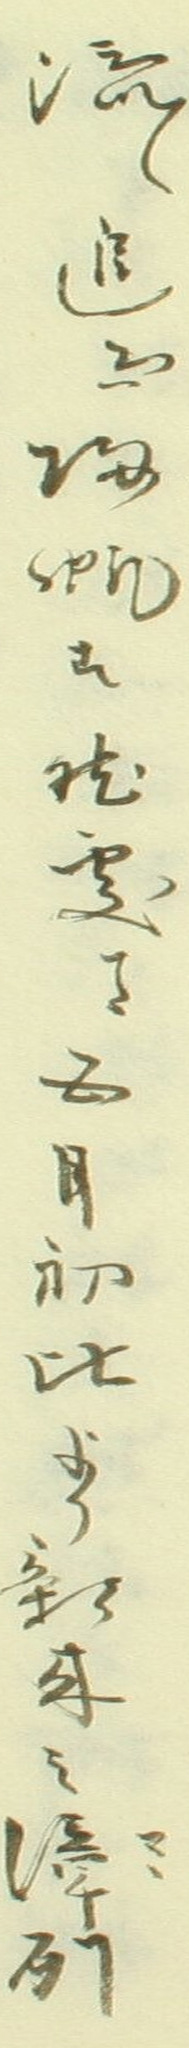流候追而帰帆は然處？五月初頃より新来の障別
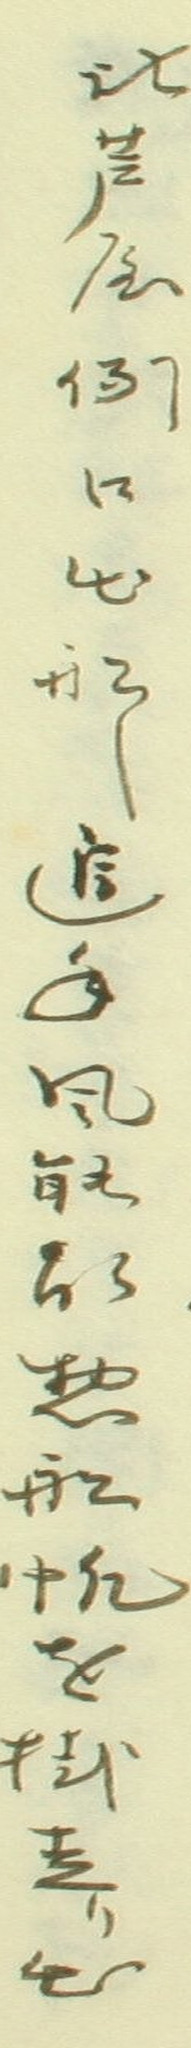頃芦屋例口出船し追手風能故惣船帆を掛走り出
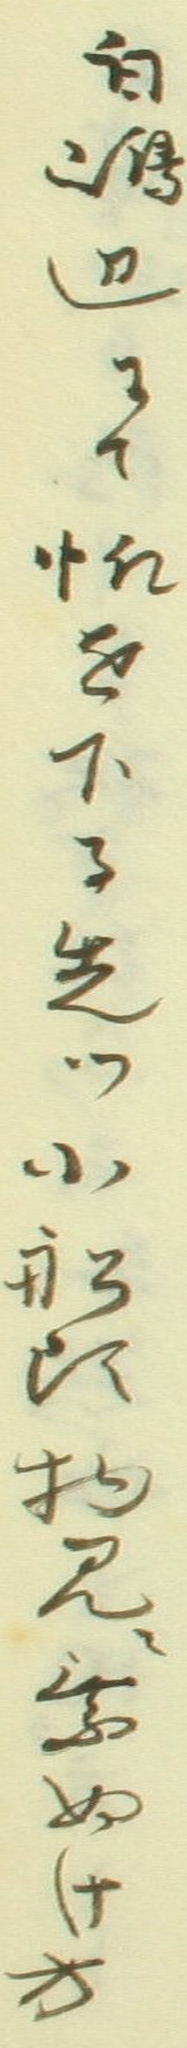白嶋辺にて帆を下る先小船頭物見に乗ぬけ方

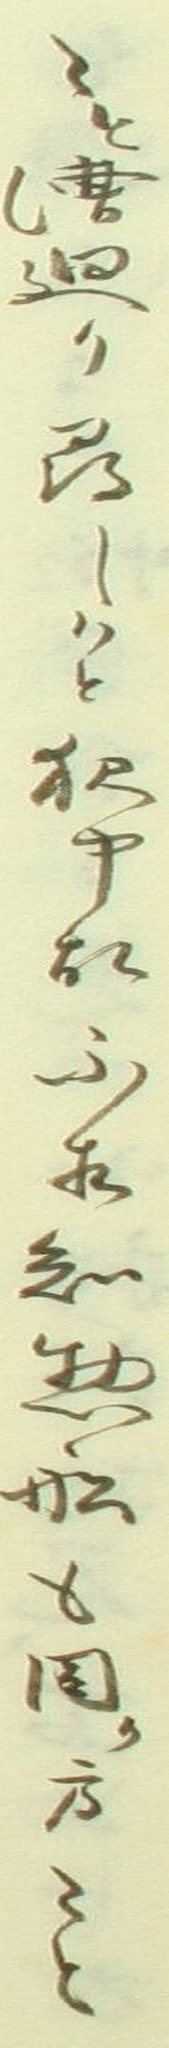方と漕廻り懸し候と夜中故不相知惣船も周り方々と
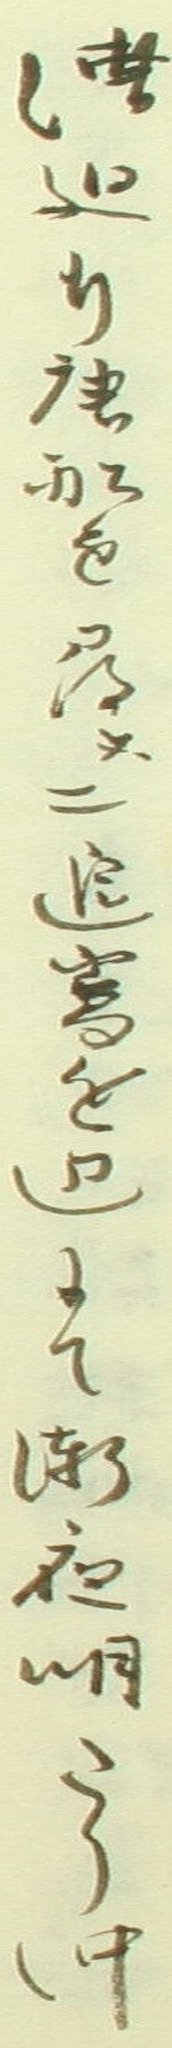漕廻行唐船を尋？に追？近追にて漸夜明たり沖
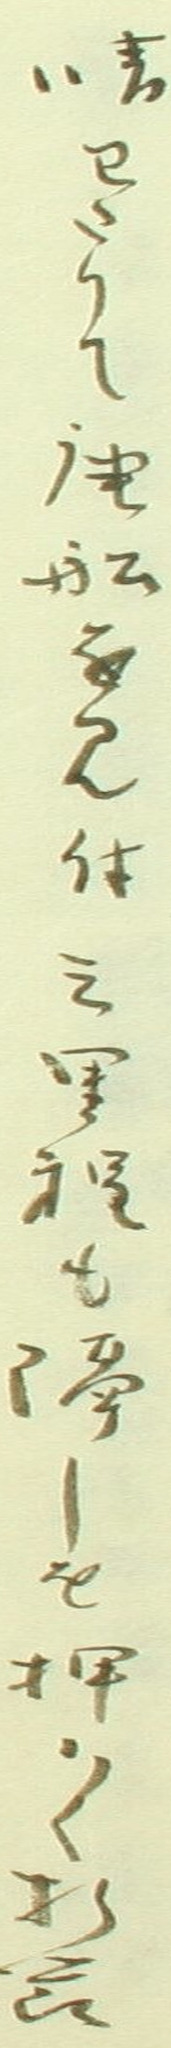晴わたりて唐船を見付三里程も隔しを押かく折節
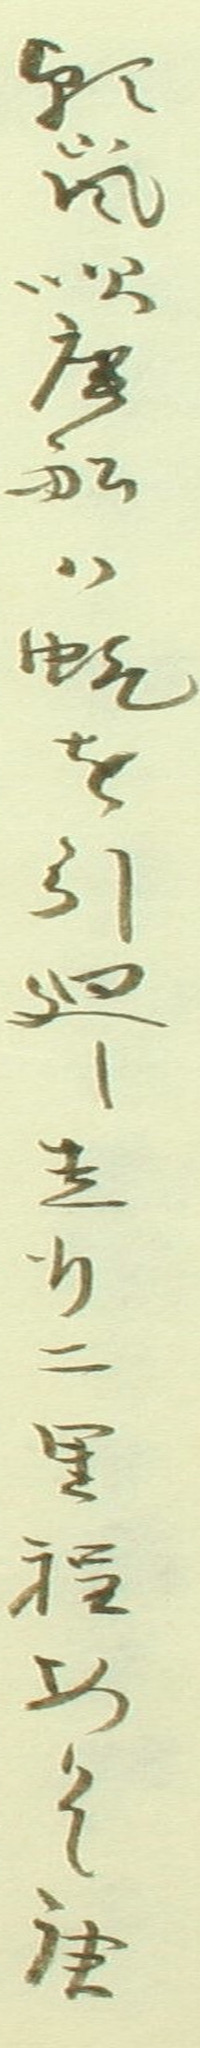朝嵐吹唐船は帆を引廻し走行二里程ありて唐
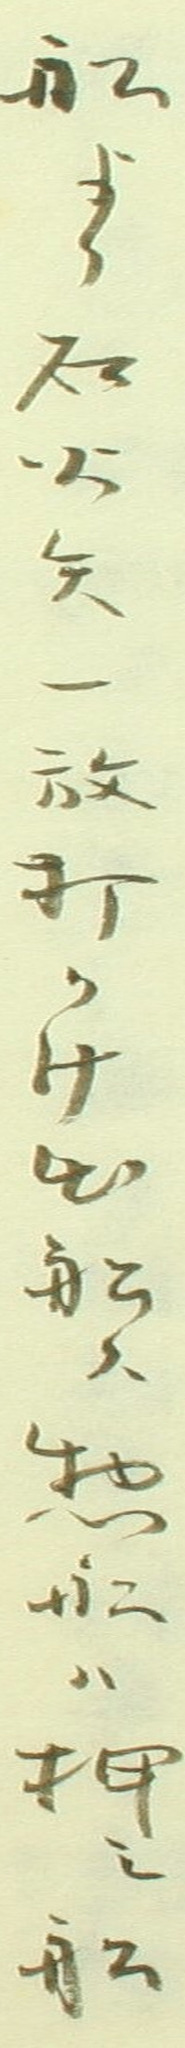船より石火矢一打かけ出船す惣船は押し船にて
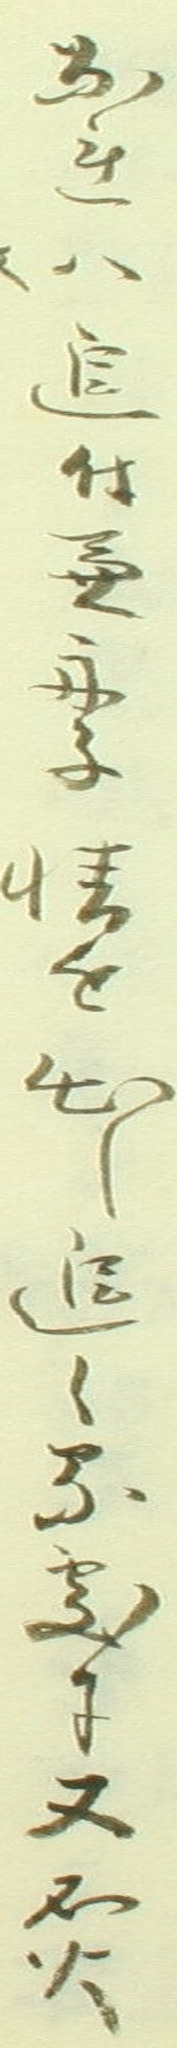なれは追付兼舟子情を出し追くる處に又石火
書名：唐船漂流記 三
